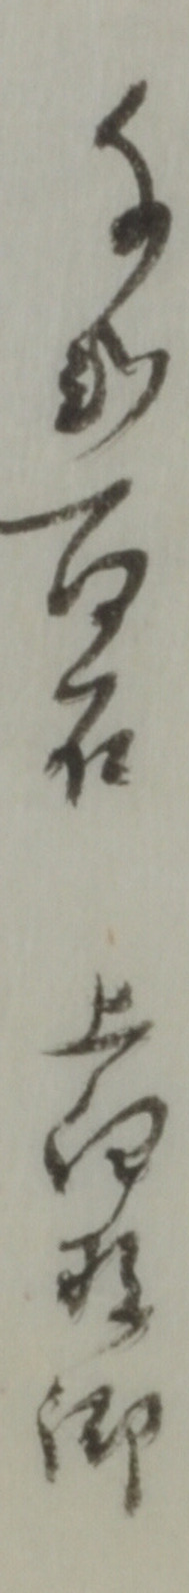千弐百石上伊那郷
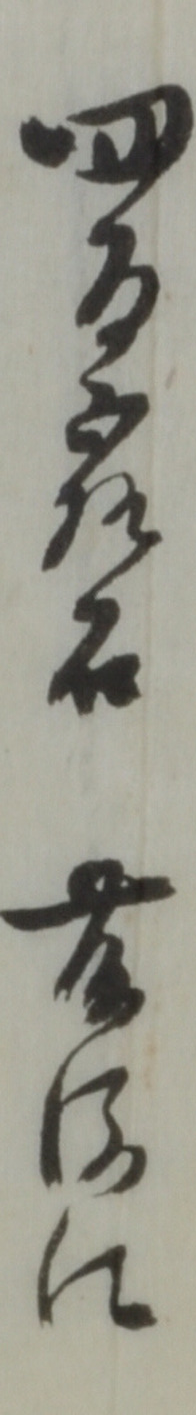四百五拾石藤沢郷
